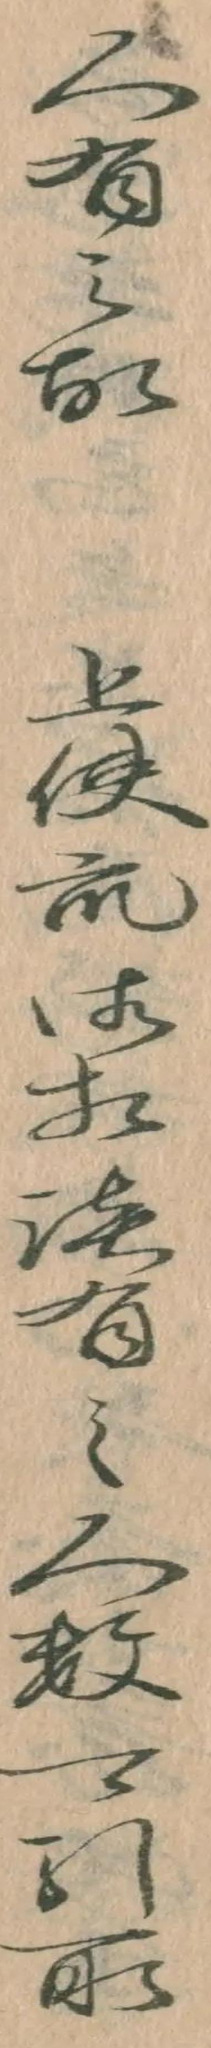人有之故上使衆御相談有之人数可引取
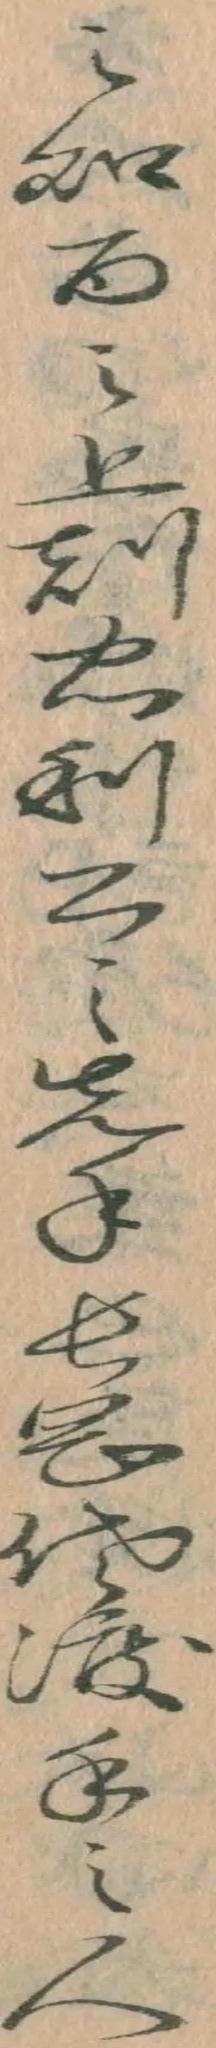之処酉之上刻忠利公之先手長岡佐渡手之人
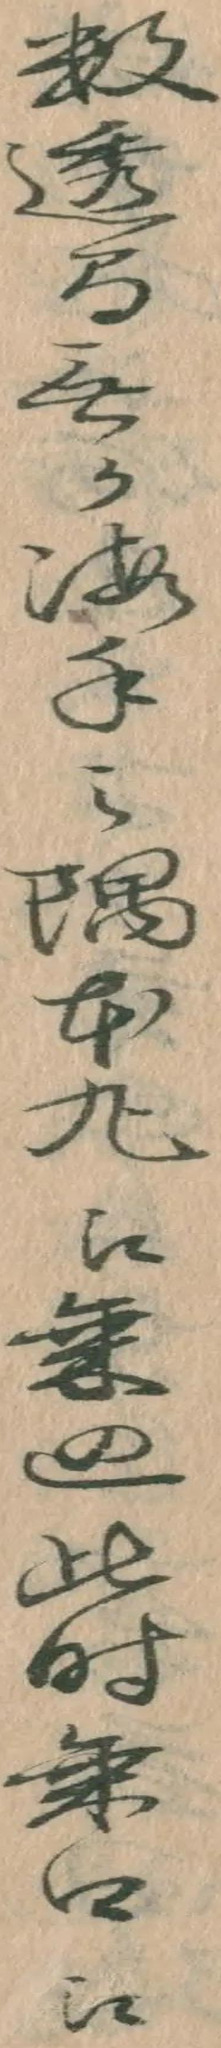数透間無く海手之隅本丸江乗込此時乗口江
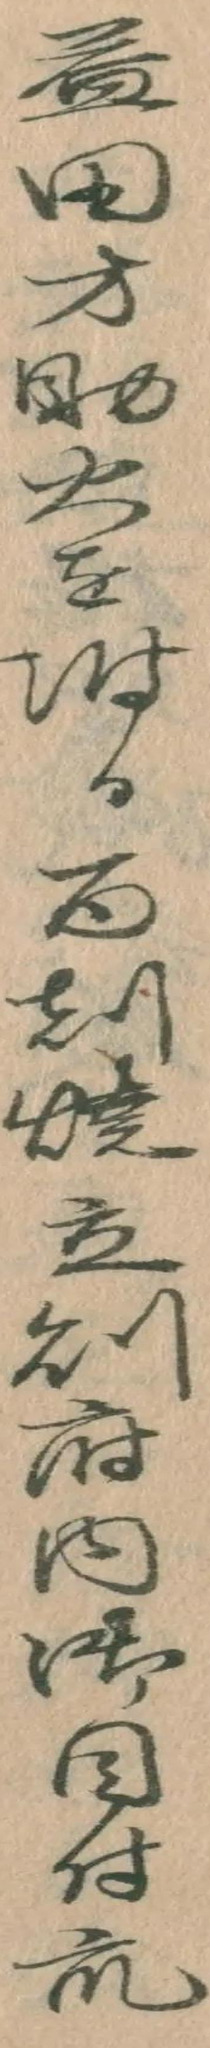益田才助火を附る酉刻焼立則府内御目付衆
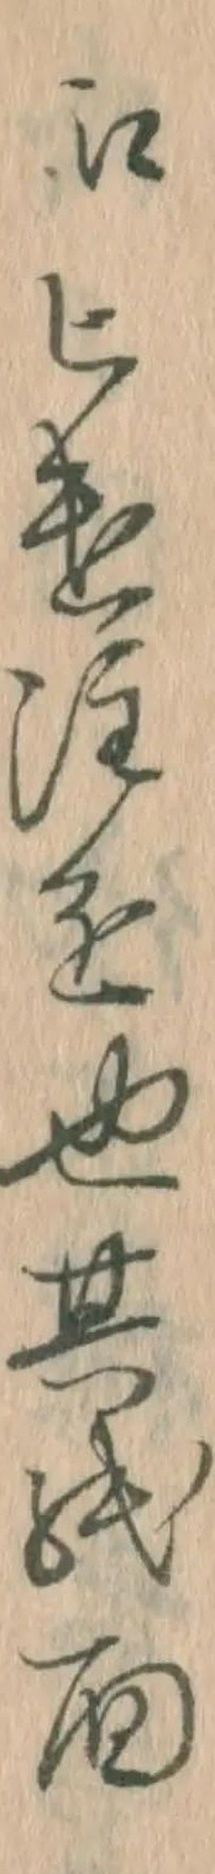江被遣注進也其紙面
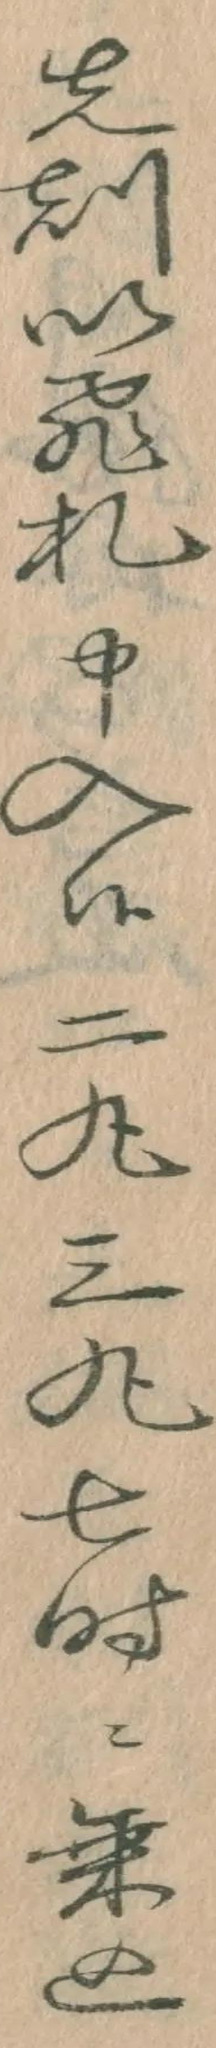先刻以飛札申入候二丸三丸七時に乗込
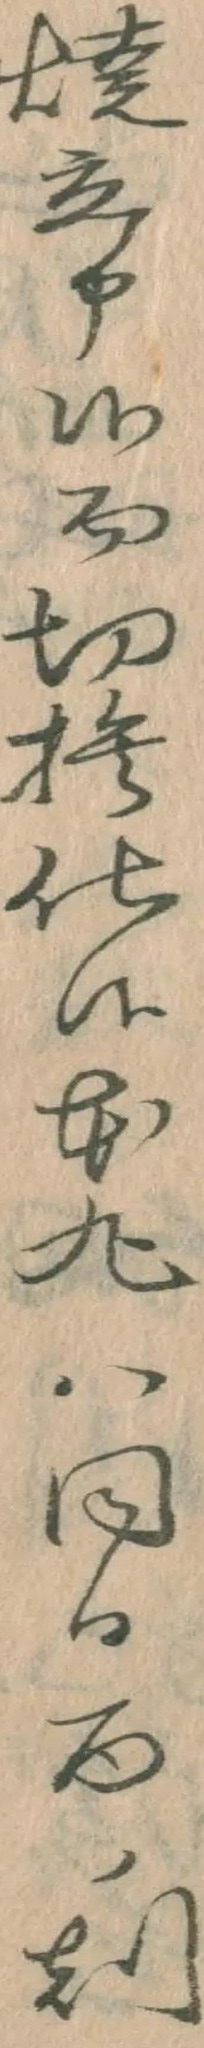焼立申候而切捨仕候本丸は同日酉之刻
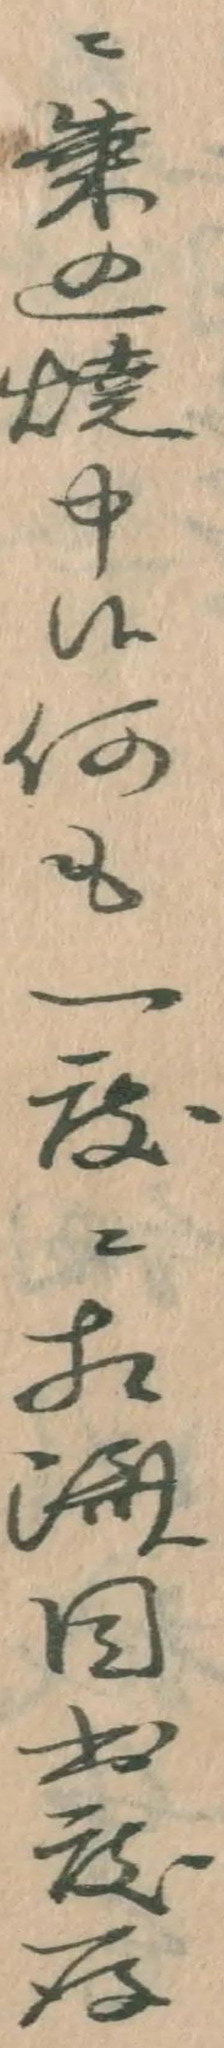に乗込焼申候何も一度に相済目出度存
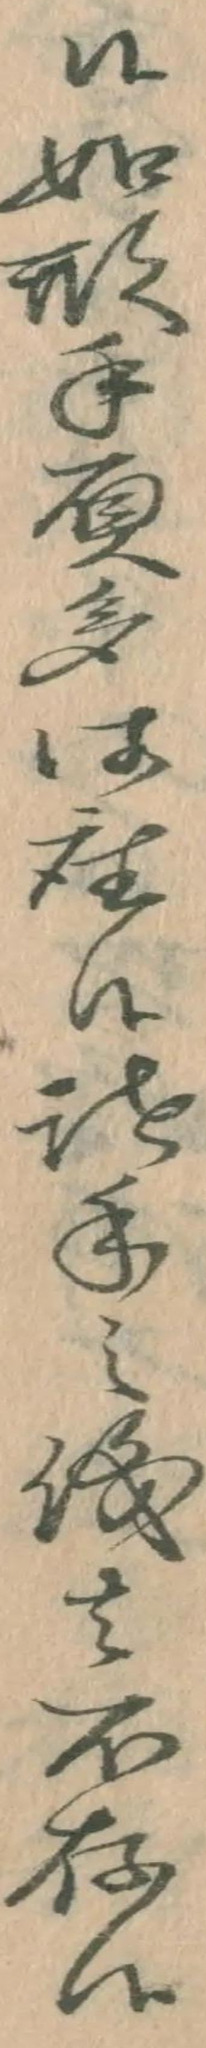候如形手負多御座候諸手之儀者不存候

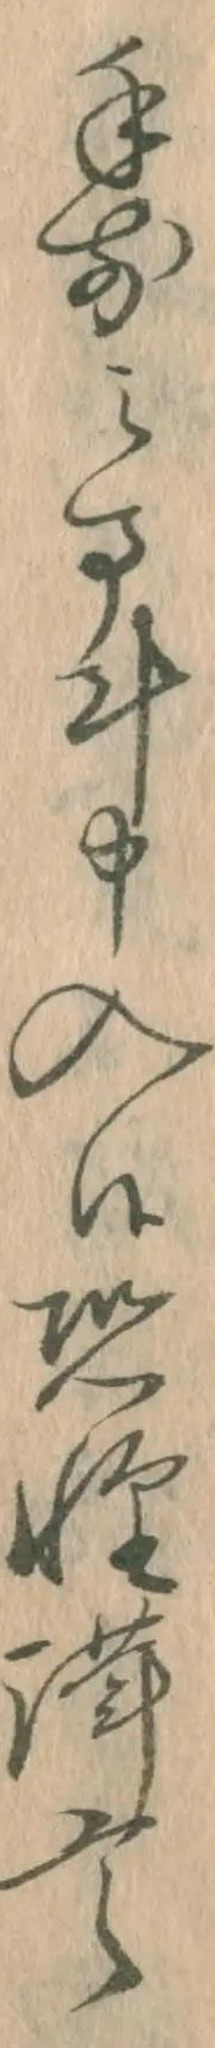手前之事斗申入候恐惶謹言
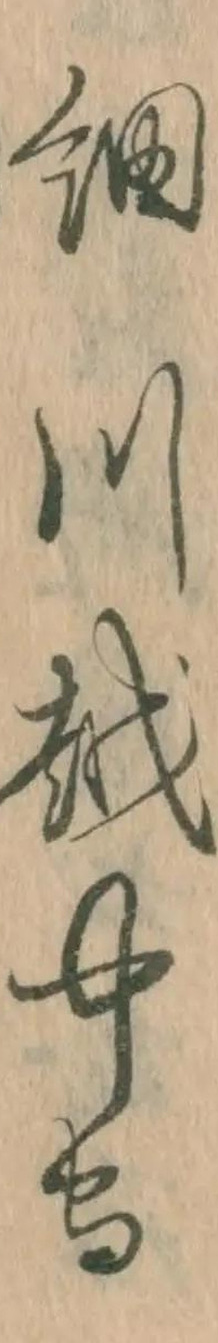酉刻細川越中守
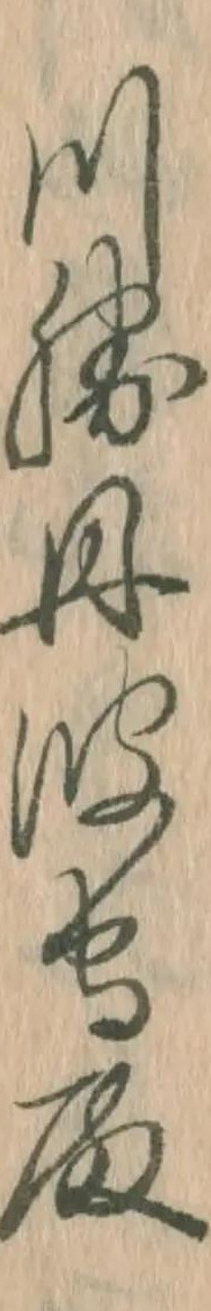川勝丹波守殿
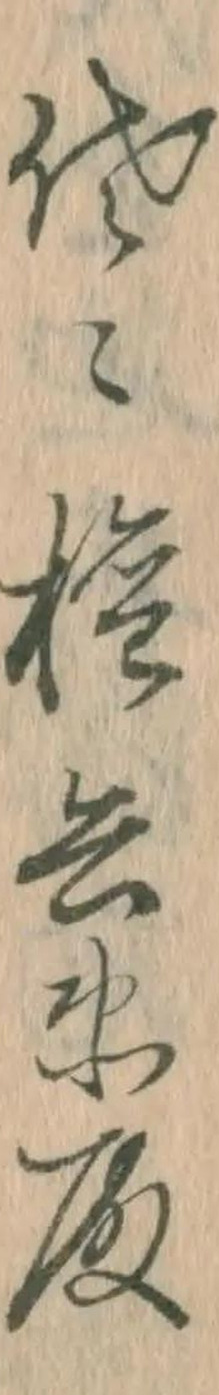佐々権兵衛殿
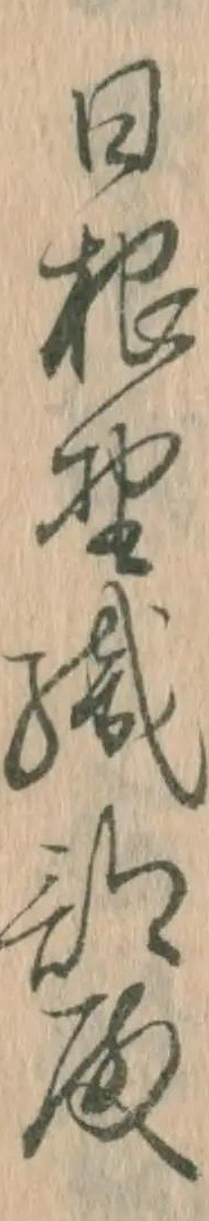日根野織部殿
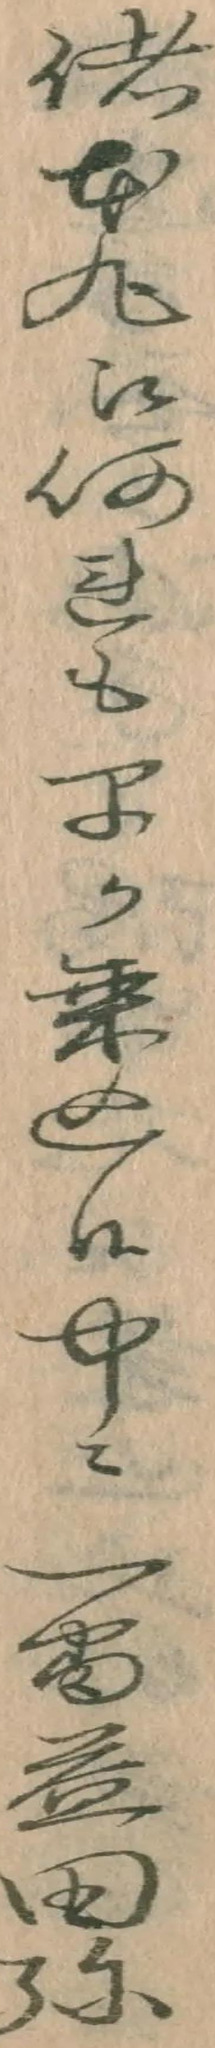偖本丸江何連も早く乗込候中に一番益田弥
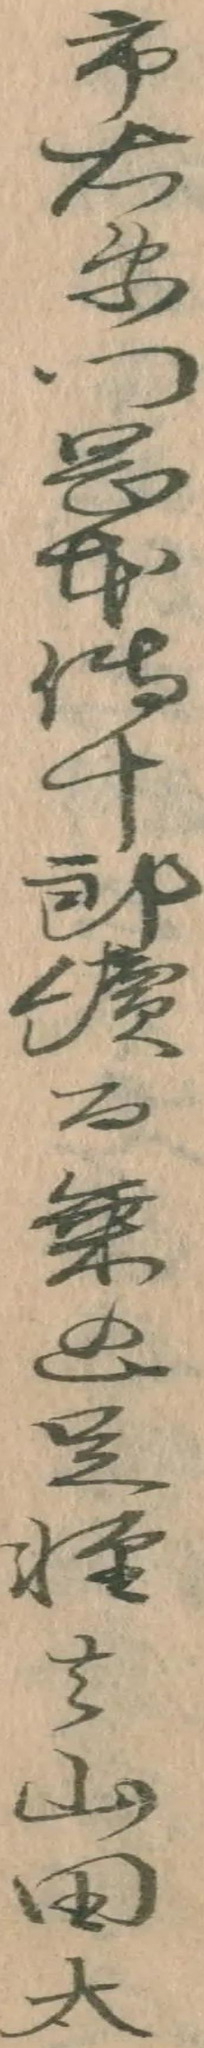市右衛門岡本伝十郎続而乗込足軽者山田太
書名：切支丹御退治記 49巻. [8]
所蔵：国立国会図書館 National Diet Library, JAPAN
